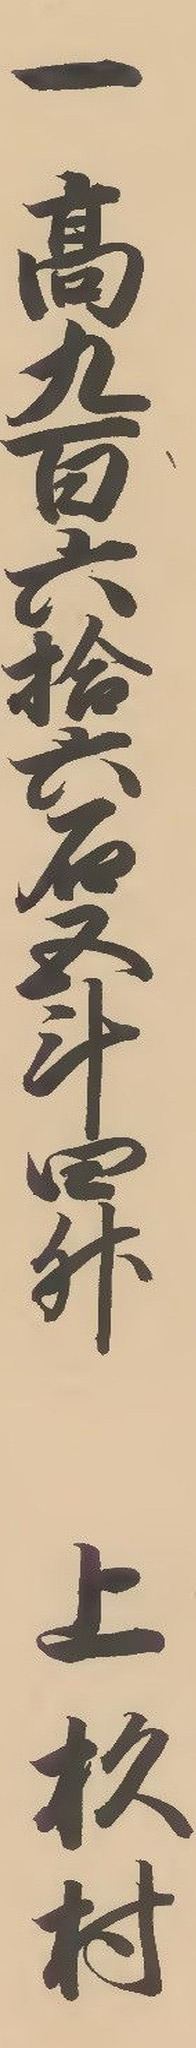一高九百六拾六石五斗四升上杉村

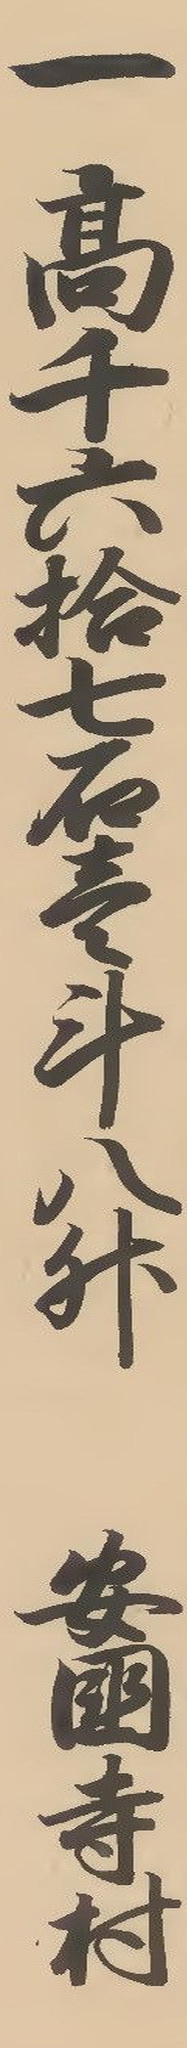一高千六拾七石壱斗八升安国寺村
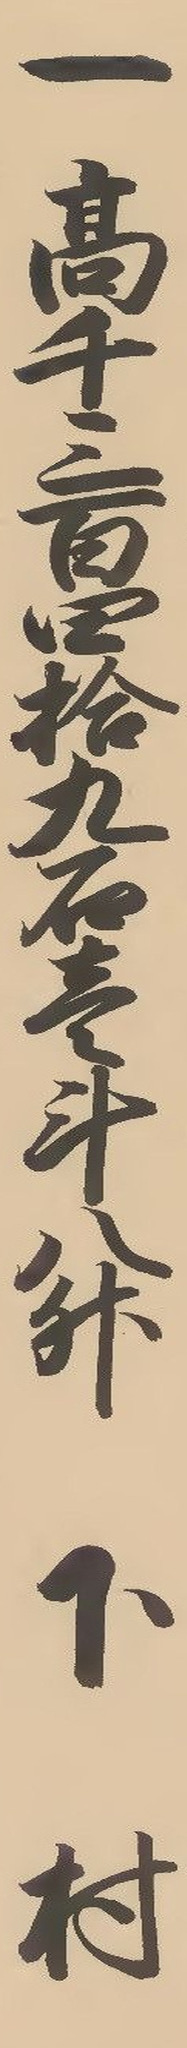一高千三百四拾九石壱斗八升下村
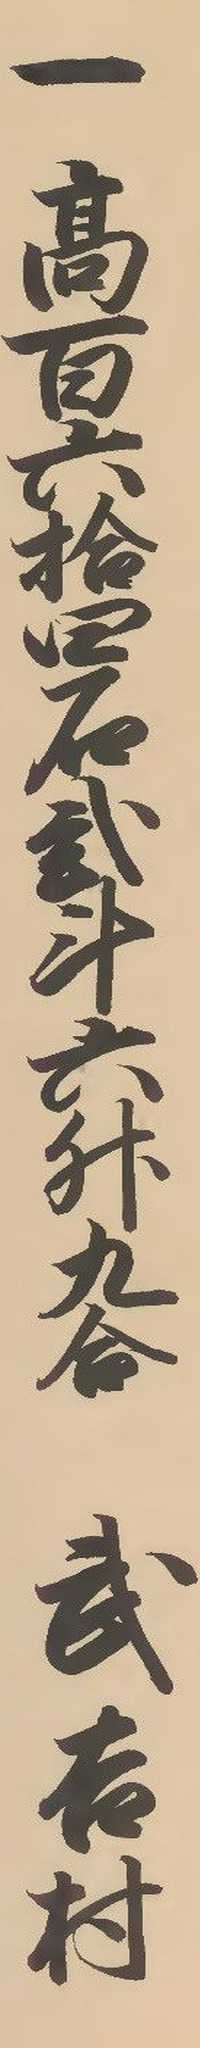一高百六拾四石弐斗六升九合武吉村
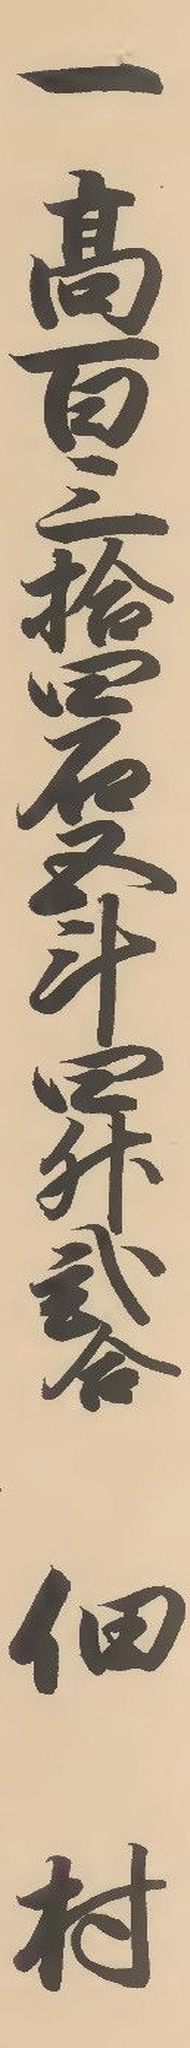一高百三拾四石五斗四升弐合佃村
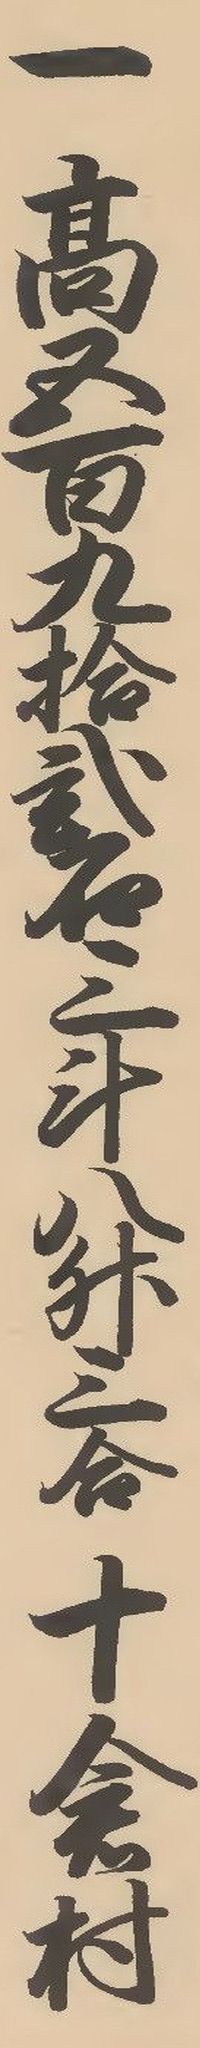一高五百九拾弐石三斗八升三合十倉村
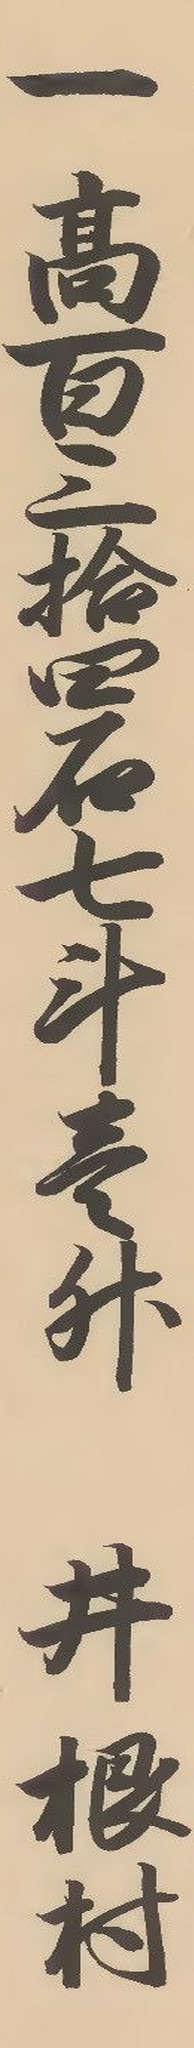一高百三拾四石七斗壱升井根村

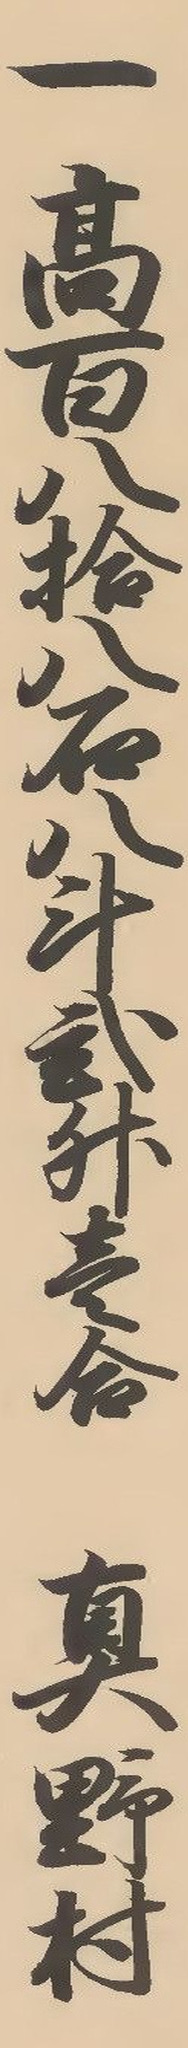一高百八拾八石八斗弐升壱合真野村
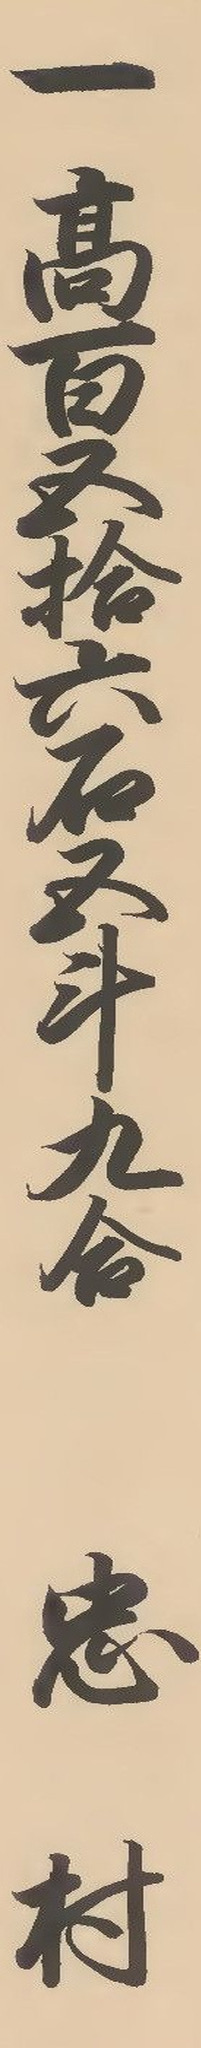一高百五拾六石五斗九合忠村
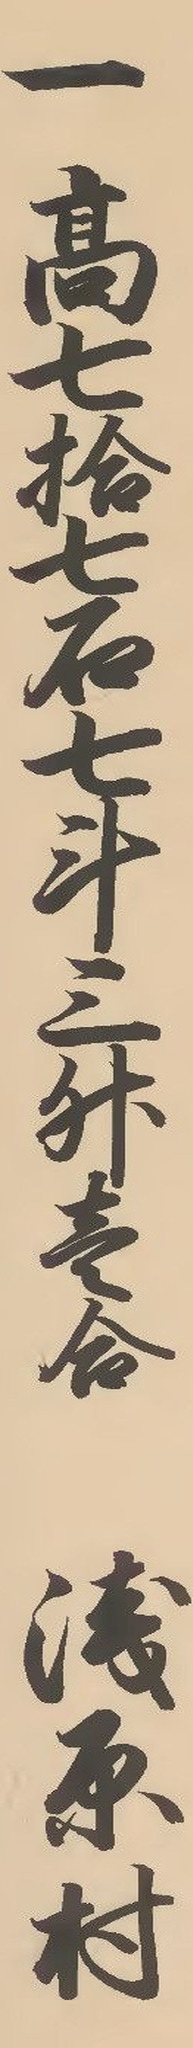一高七拾七石七斗三升壱合浅原村
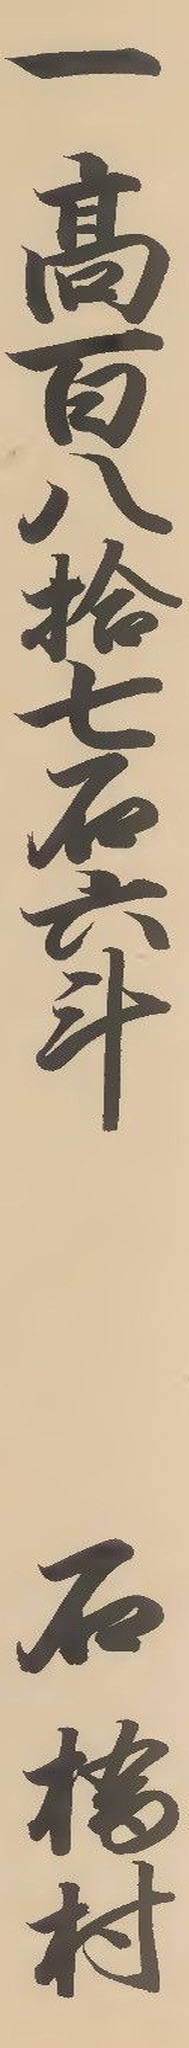一高百八拾七石六斗石橋村
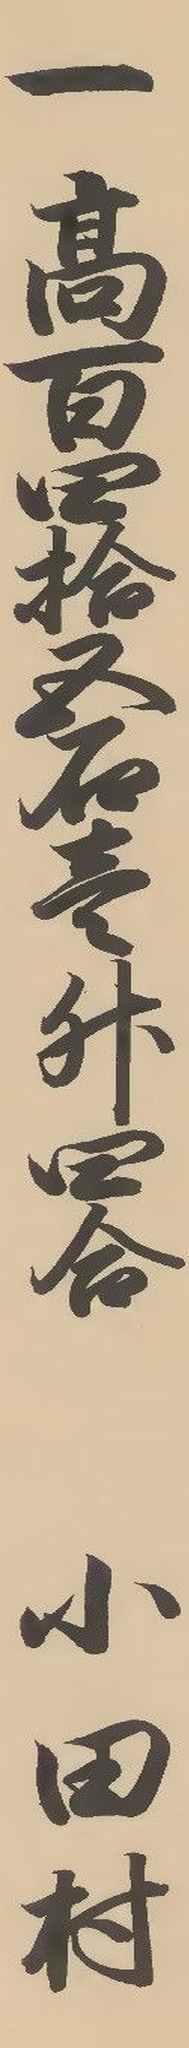一高百四拾五石壱升四合小田村
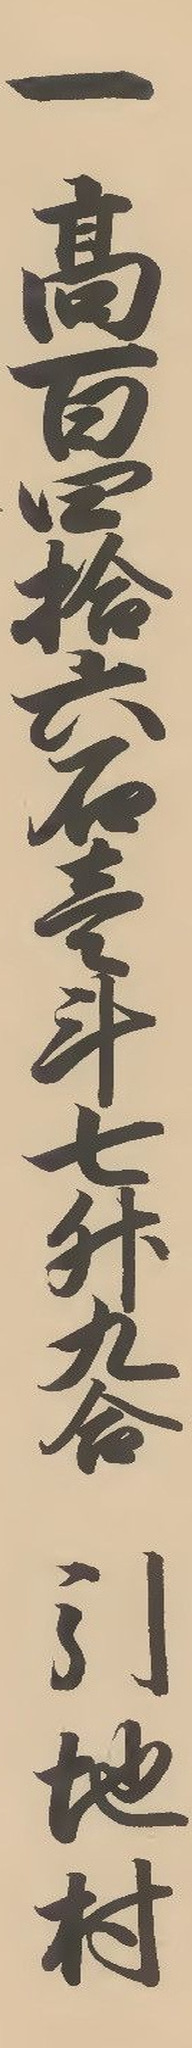一高百四拾六石壱斗七升九合引地村
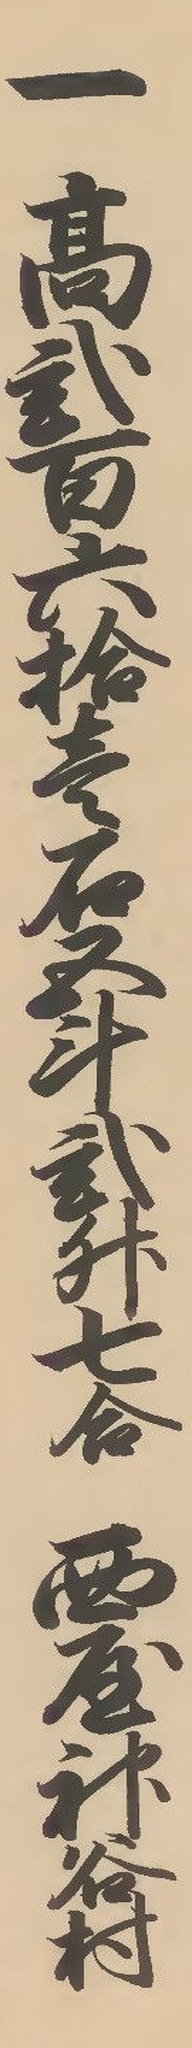一高弐百六拾壱石五斗弐升七合西屋神谷村

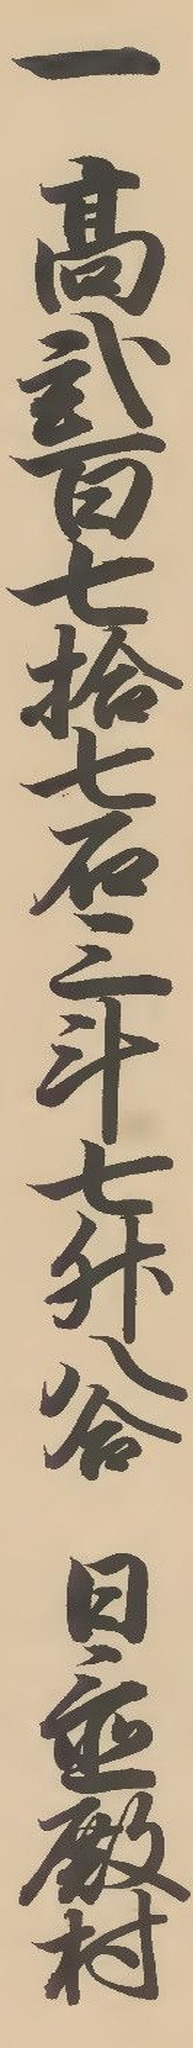一高弐百七拾七石三斗七升八合日置殿村
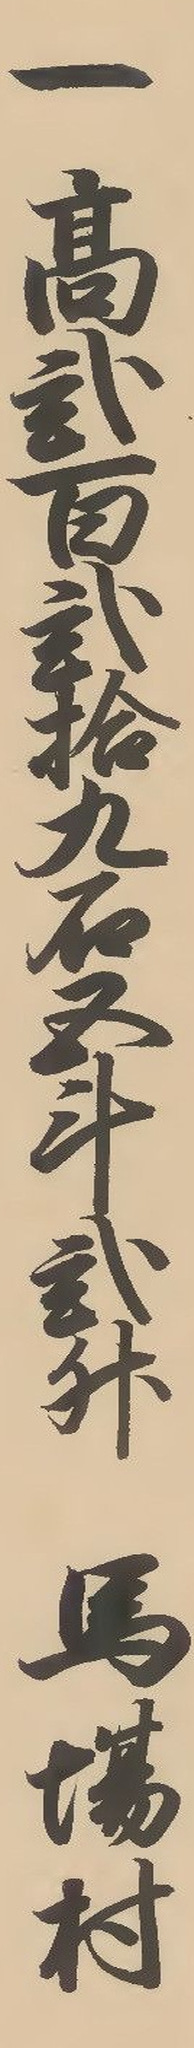一高弐百弐拾九石五斗弐升馬場村
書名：丹波国郷帳
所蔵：国立公文書館 National Archives of Japan
